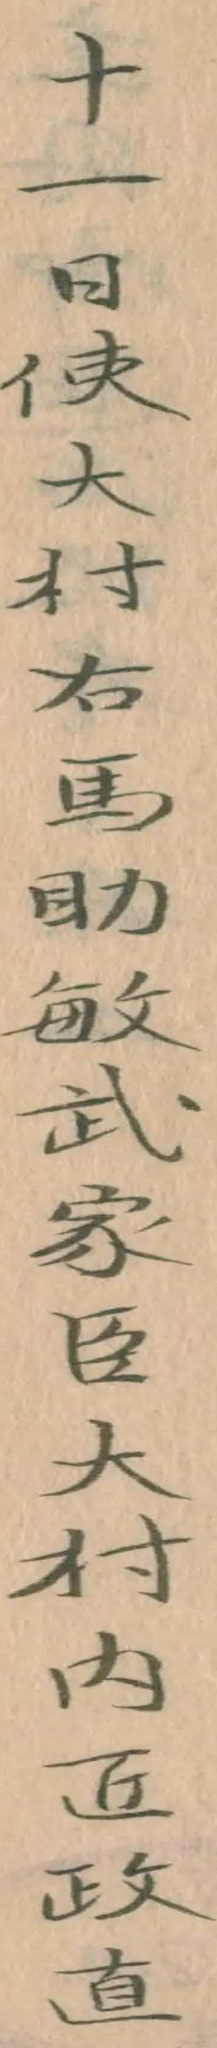十一月使大村右馬助敏武家臣大村内匠政直
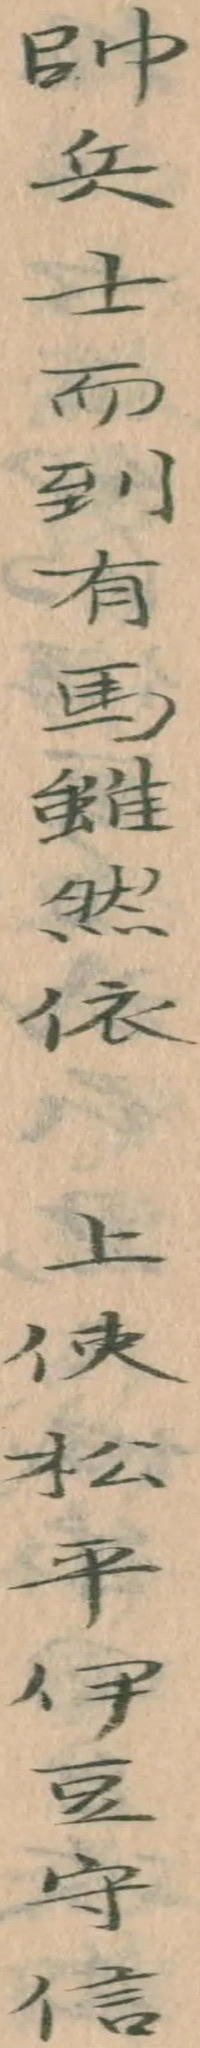帥兵士而到有馬雖然依上使松平伊豆守信
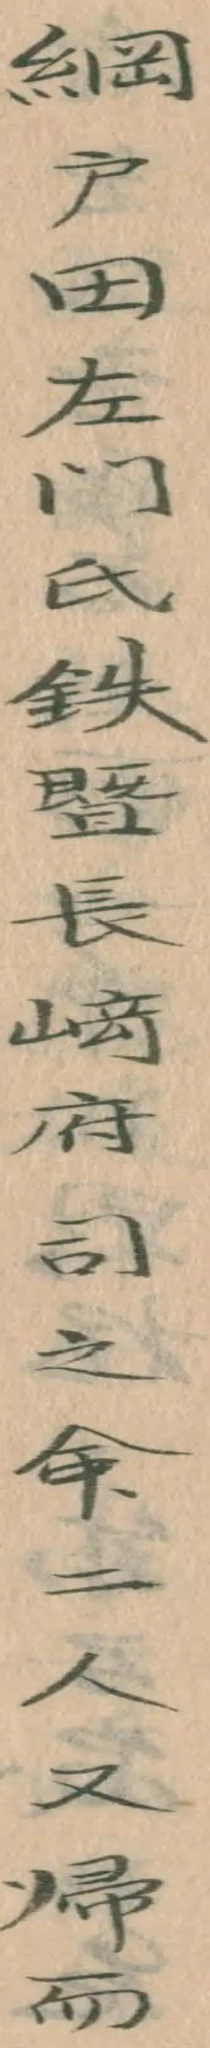綱戸田左門氏鉄監長崎府司之命二人又帰而
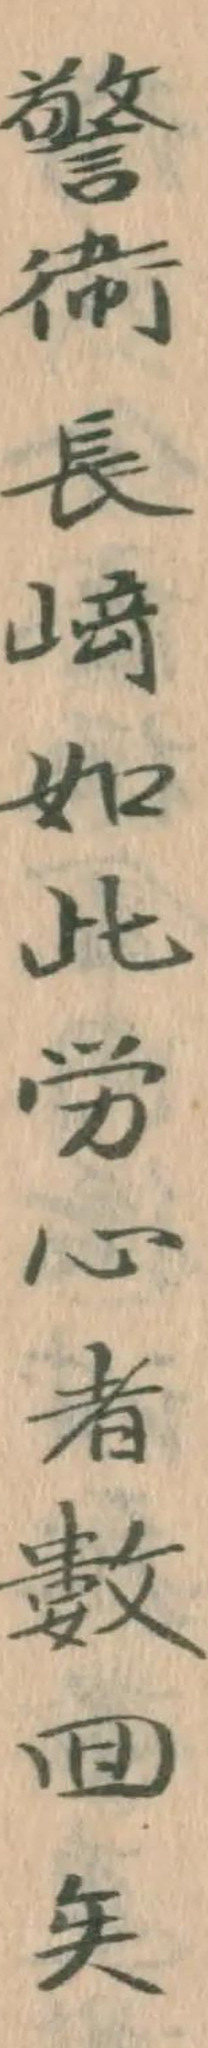警衛長崎如此労心者数回矣
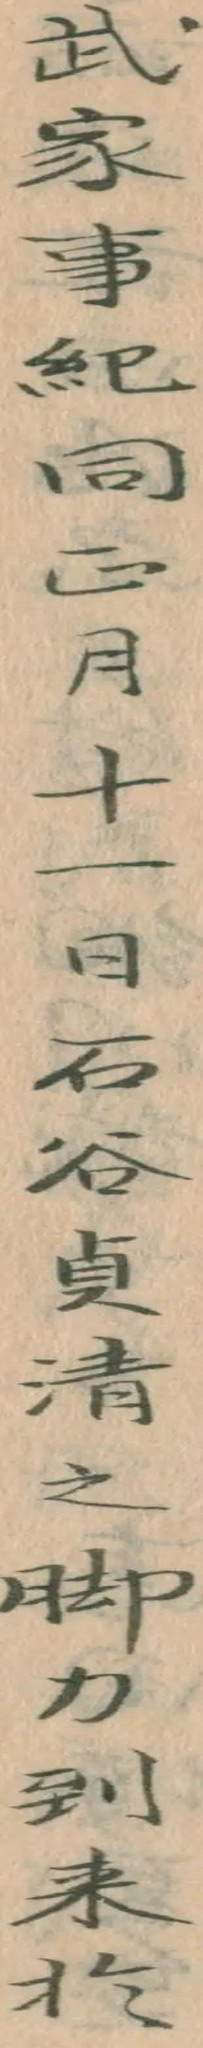武家事紀同正月十一日石谷貞清之脚力到来於
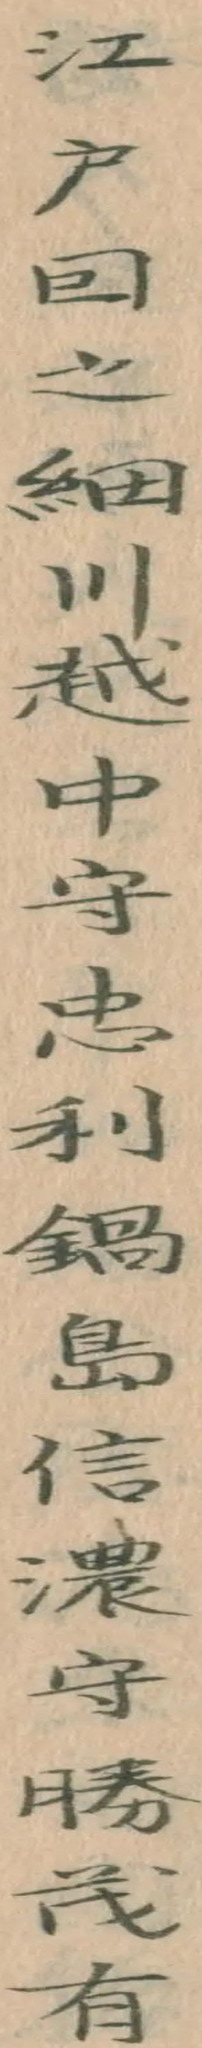江戸回之細川越中守忠利鍋島信濃守勝茂有
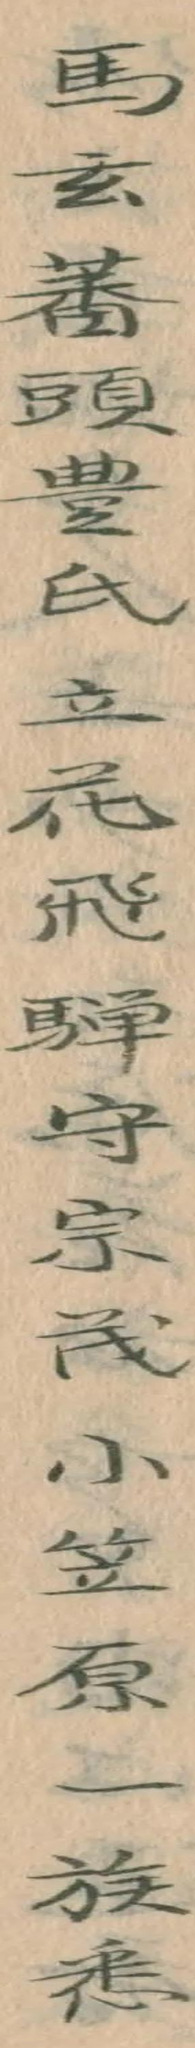馬玄蕃頭豊氏立花飛騨守宗茂小笠原一族悉
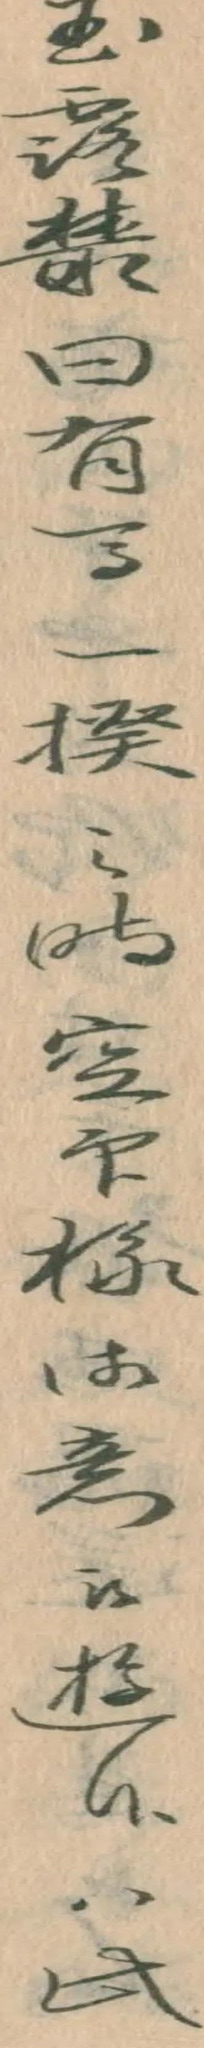玉露樷曰有馬一揆之時空印様御意被遊候は此
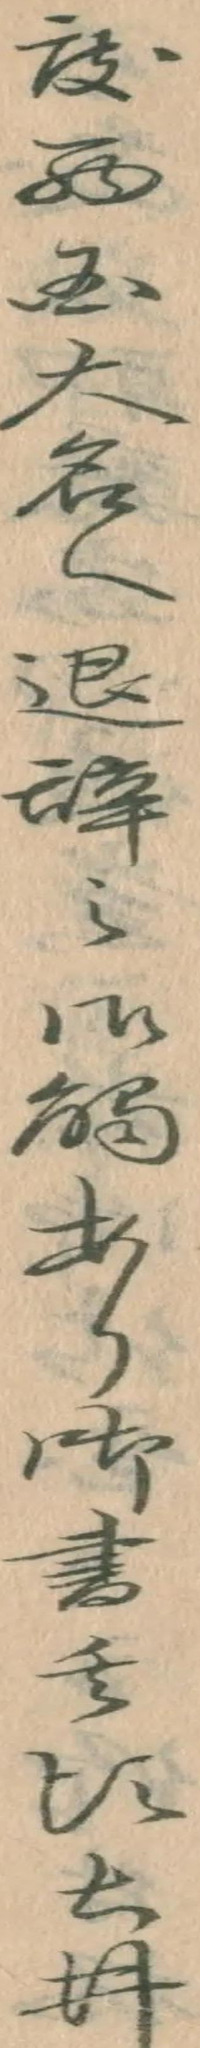度西国大名へ退辞之御触あり御書其頃土井
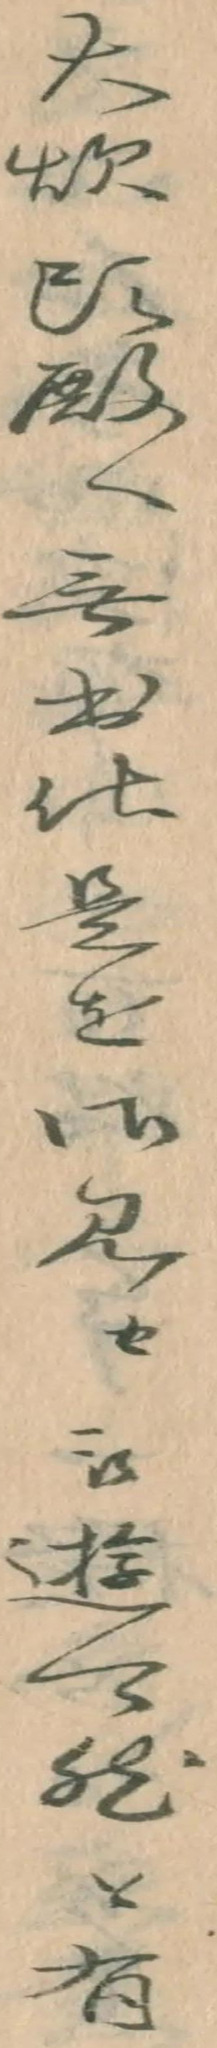大炊頭殿へ無出仕是を御見せ被遊可然と有

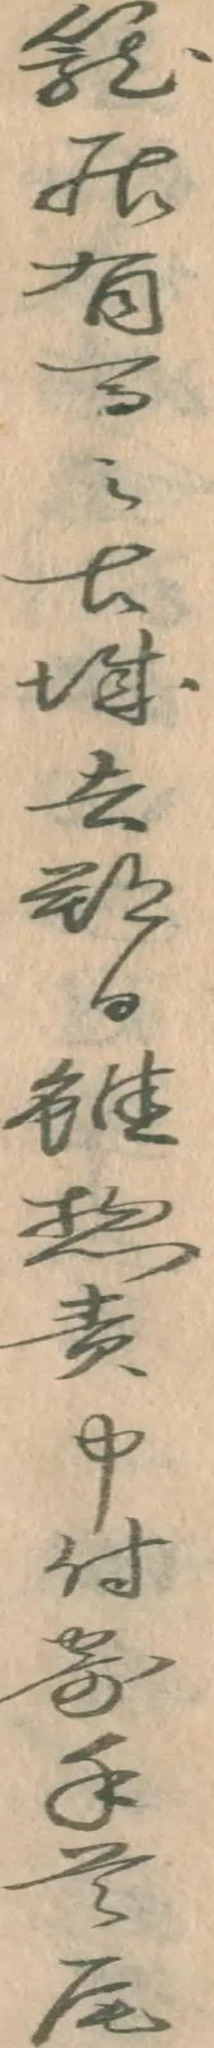籠居有馬之古城去朔日雖惣責申付寄手首尾
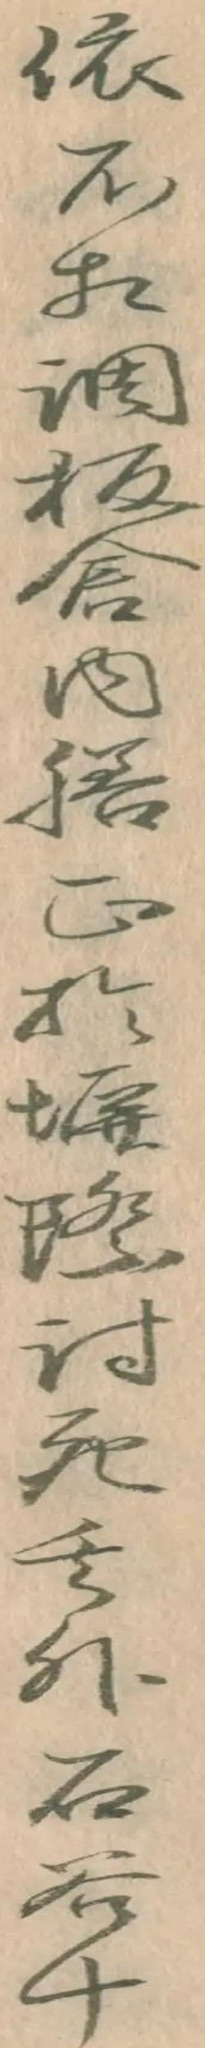依不相調板倉内膳正於塀際討死其外石谷十
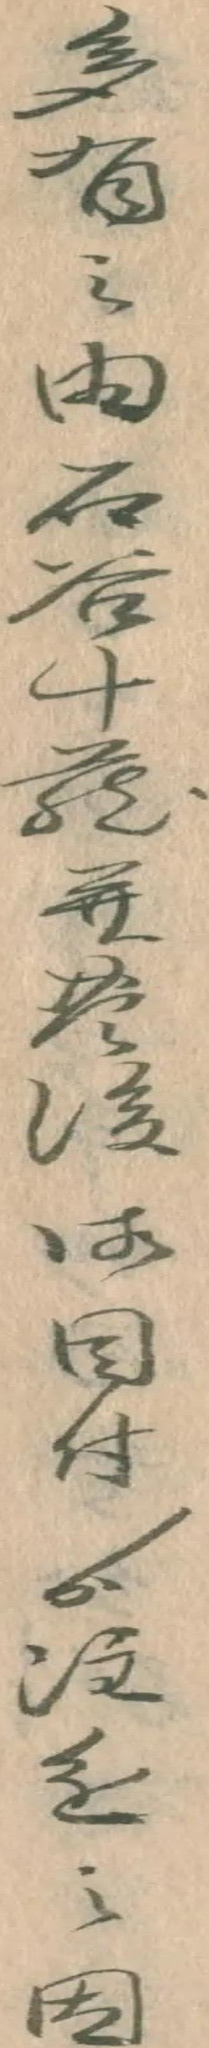多有之由石谷十蔵幷豊後御目付ゟ注進之固
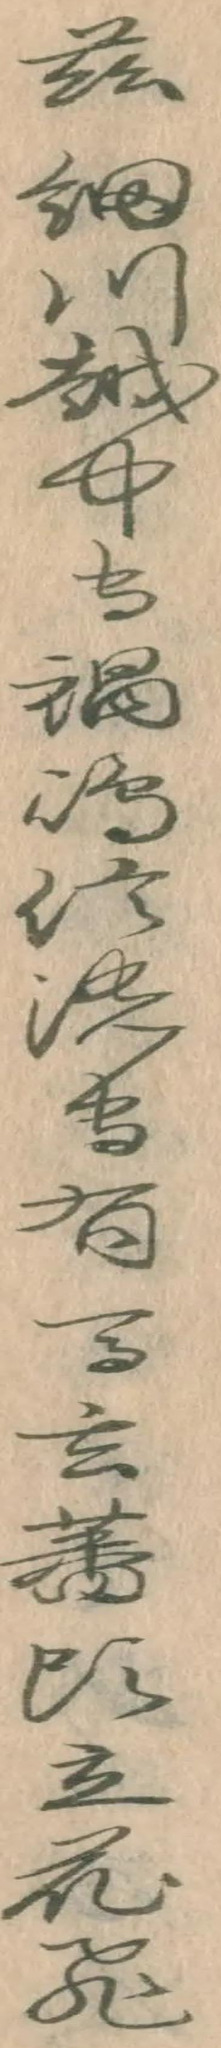茲細川越中守鍋島信濃守有馬玄蕃頭立花飛
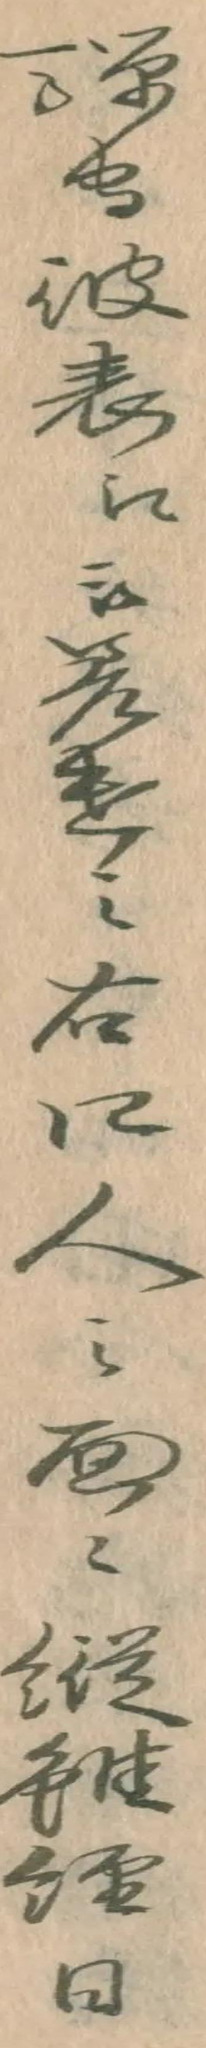騨守彼表江被差遣之右四人之面々縦雖経日
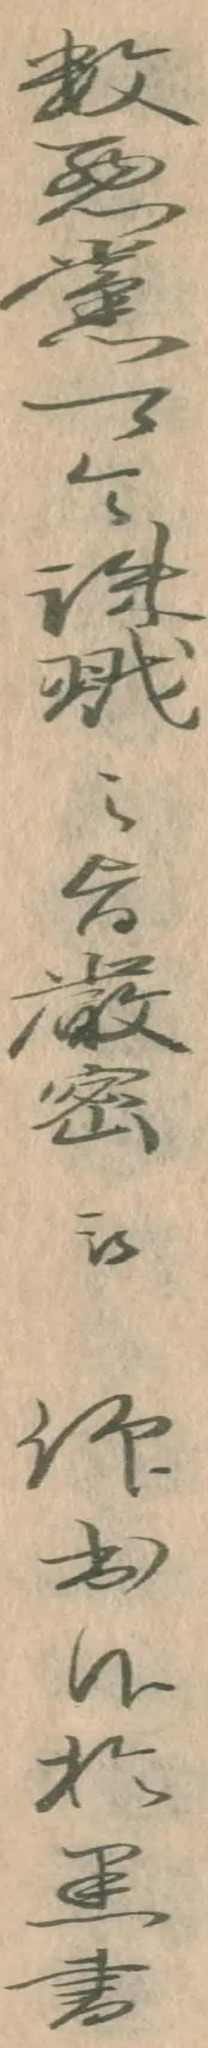数悪党可令誅戮之旨厳密被仰出候於黒書
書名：切支丹御退治記 49巻. [6]
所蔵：国立国会図書館 National Diet Library, JAPAN
